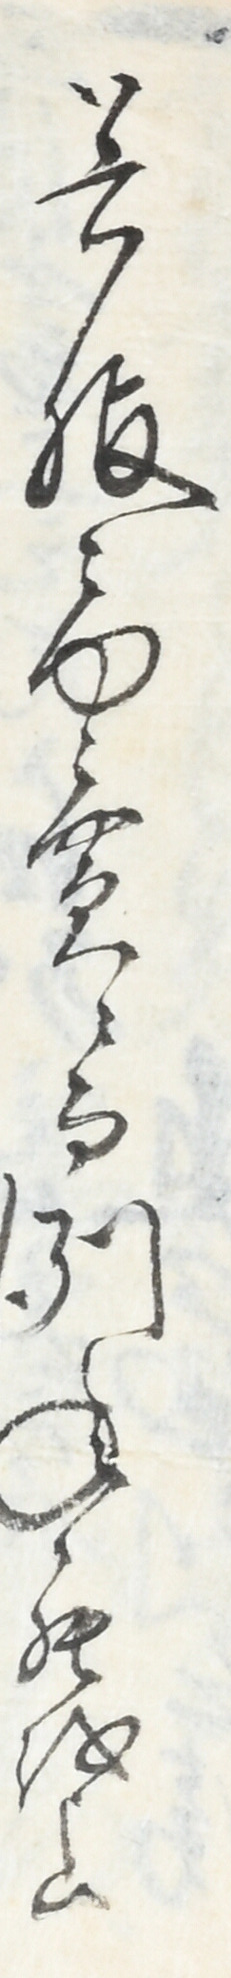押形商売ニ而例年罷越申候

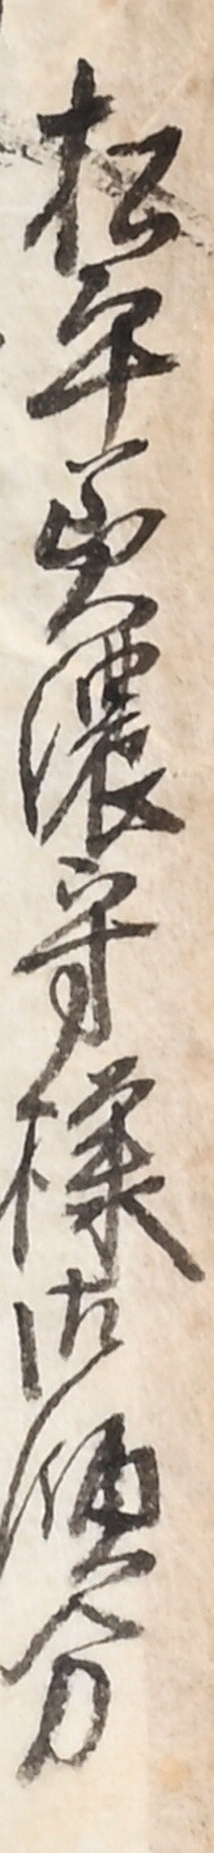松平美濃守様御領分
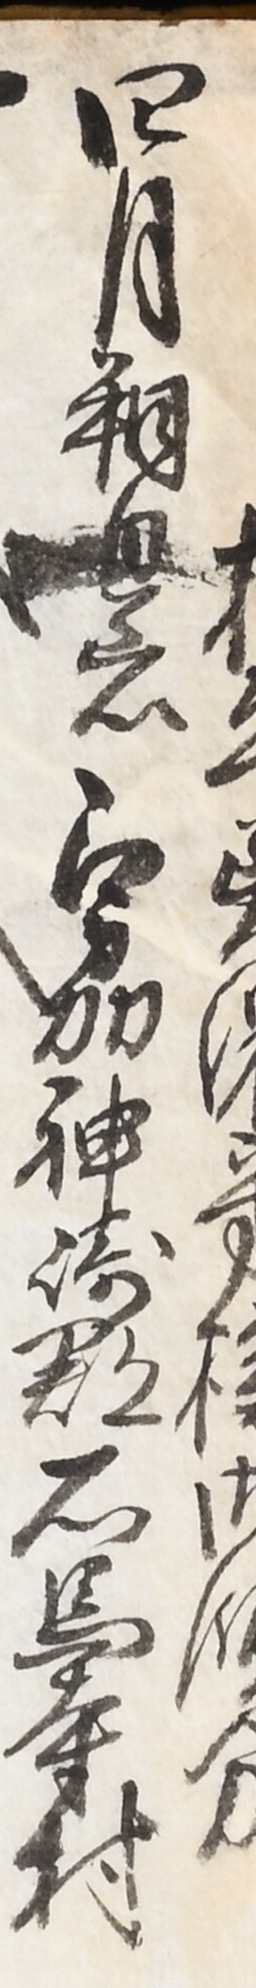四月朔日着江州神崎郡石馬寺村
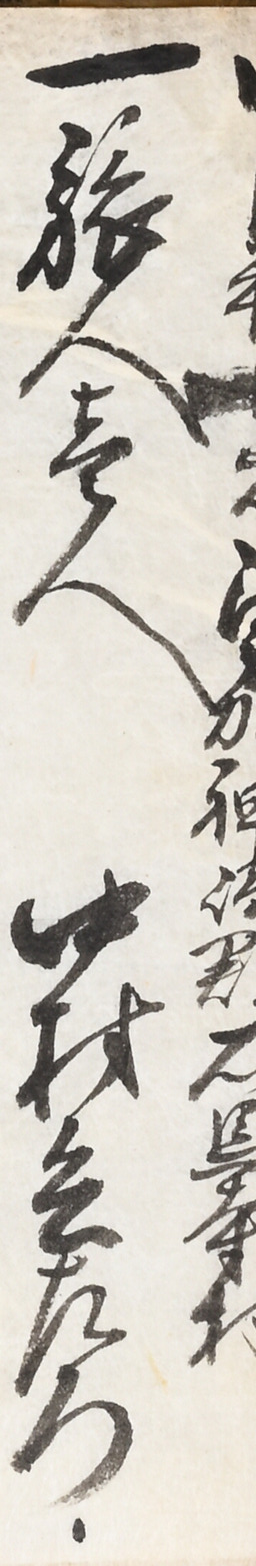一旅人壱人中村兵左衛門・
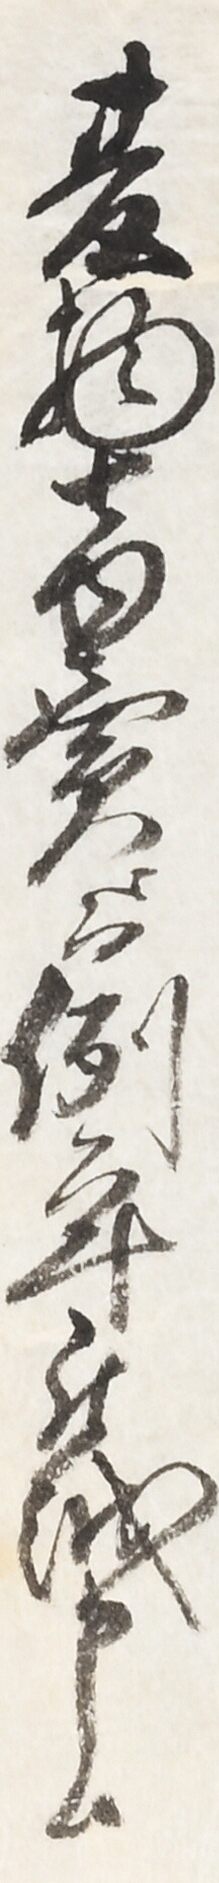夏物商売ニ而例年罷越申候
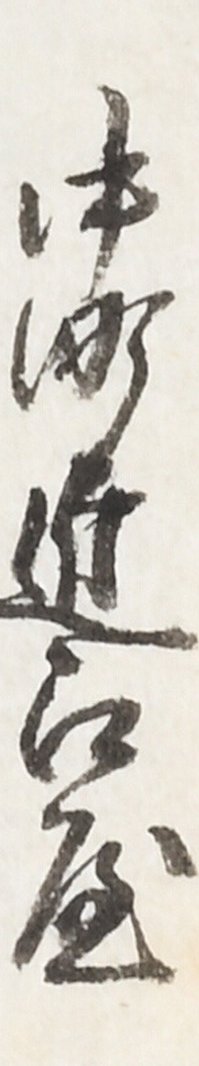中町近江屋
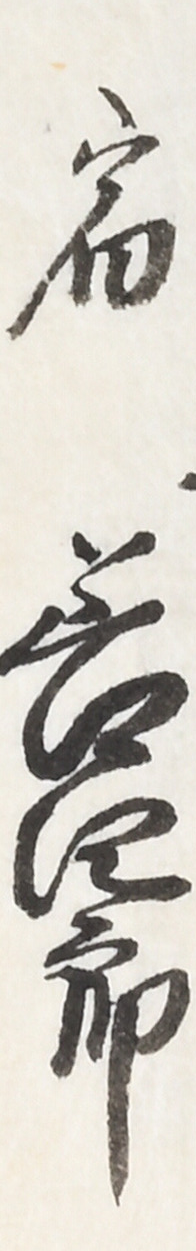宿善四郎
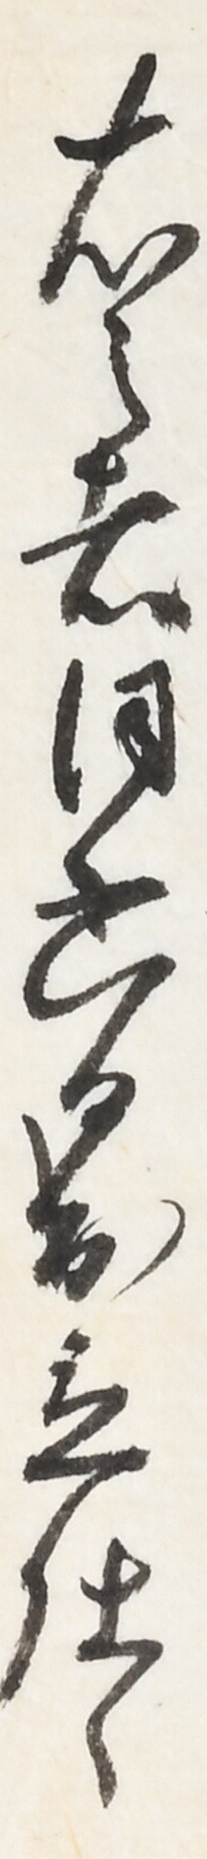右之者同六日出立仕候
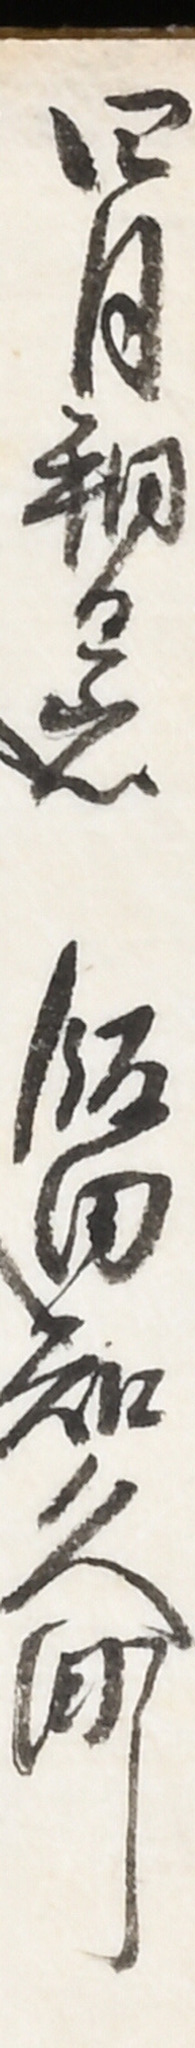四月朔日着飯田知久町
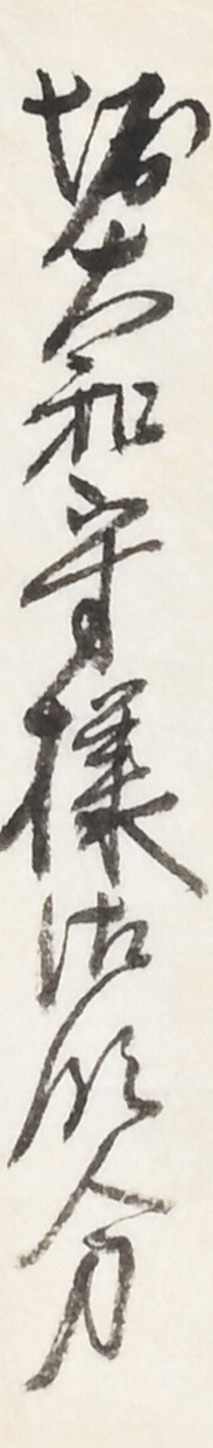堀大和守様御領分
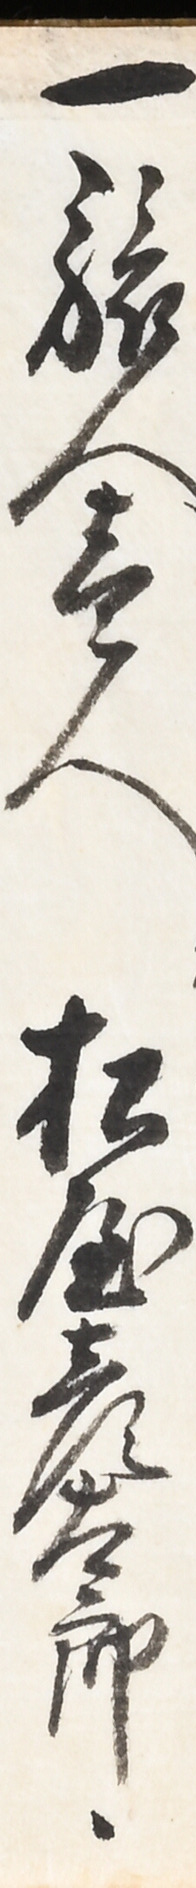一旅人壱人松屋彦太郎・
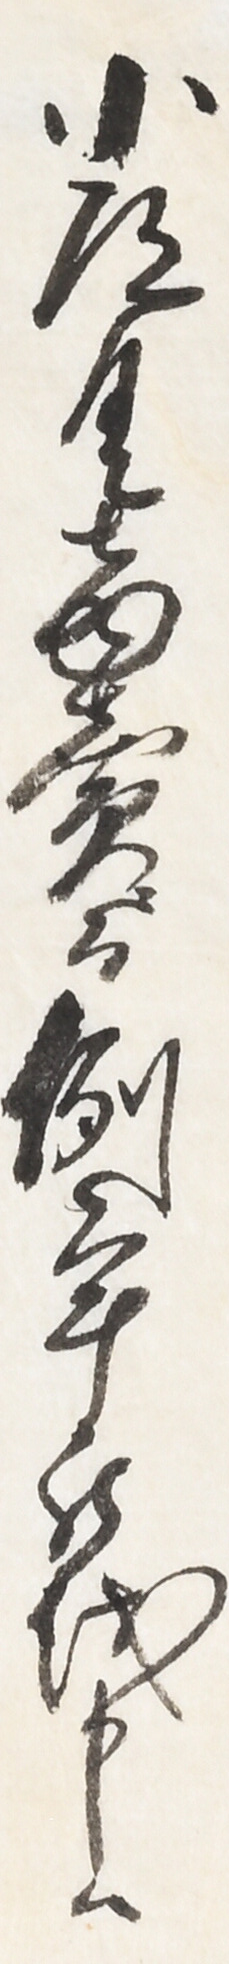小道具商売ニ而例年罷越申候
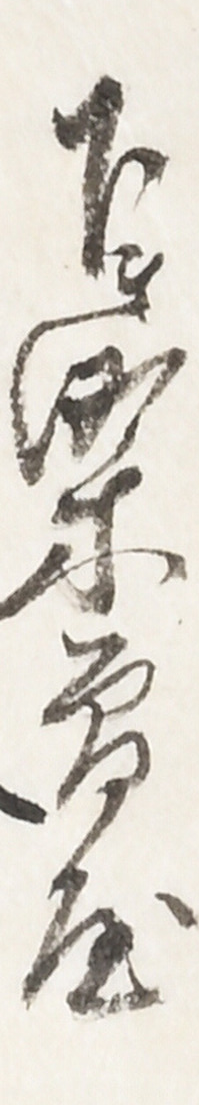下モ町木曽屋
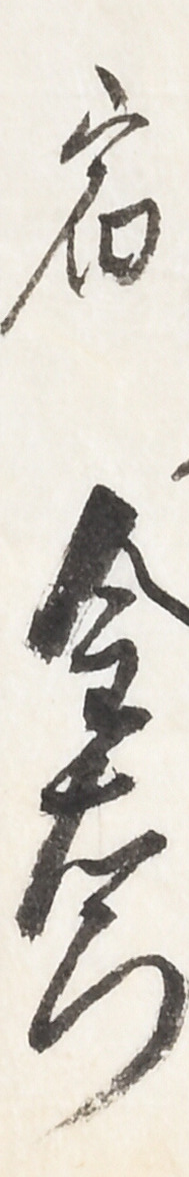宿金右衛門
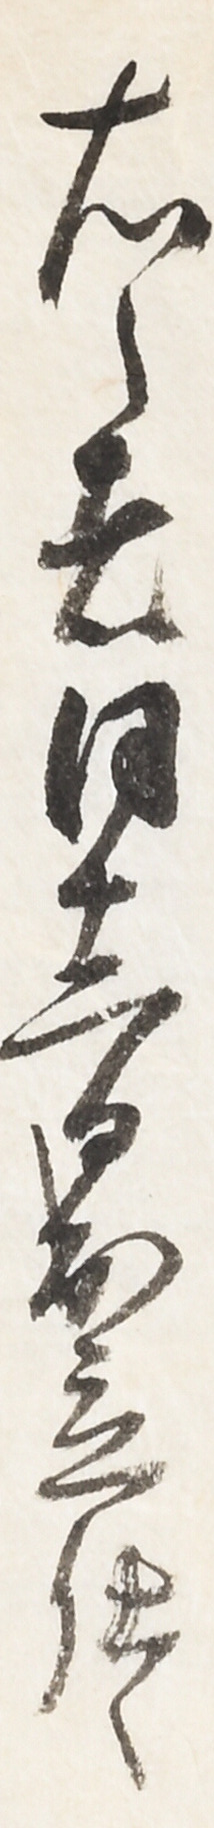右之者同十二日出立仕候
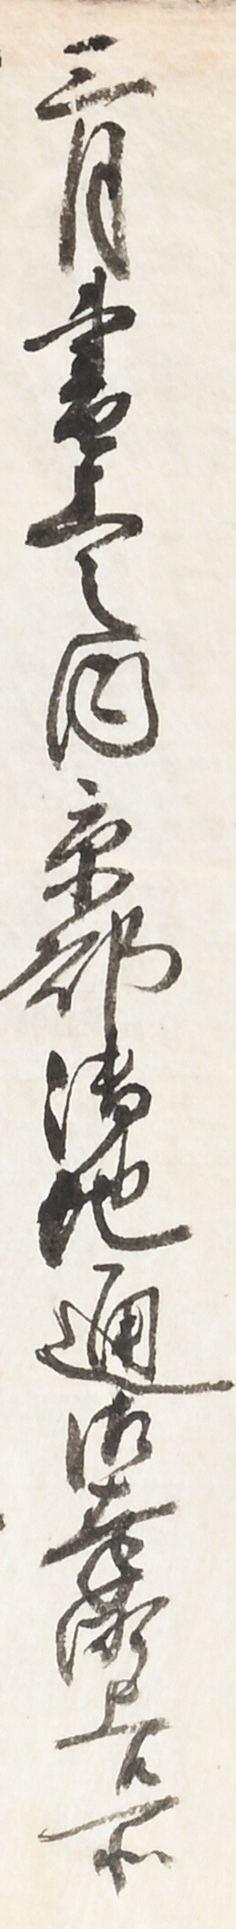三月書上之内京都御池通御幸町上ル所
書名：旅人泊控帳
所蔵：伊那市立高遠町図書館・合同会社AMANE
